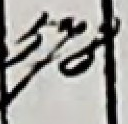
578
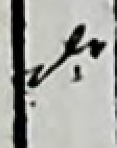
Do
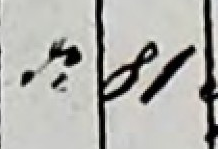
Do 81
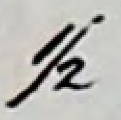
1/2
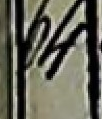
64
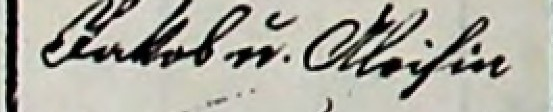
Jakob u. Aloisia
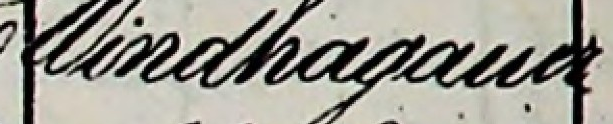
Windhagauer
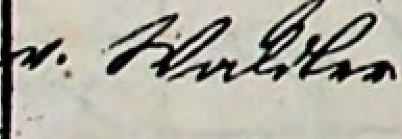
v. Waldter
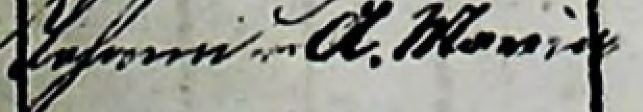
Johann u A. Maria
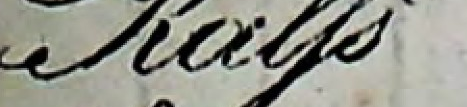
Kalss
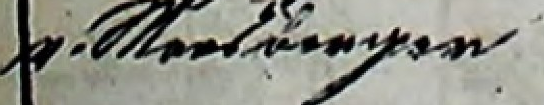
v. Meesberger
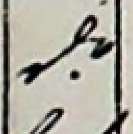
Do
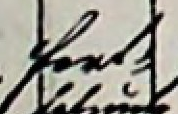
Fort„
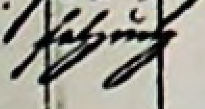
setzung
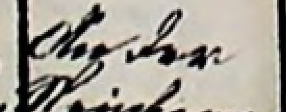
An der
